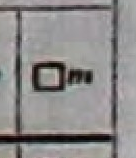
□m
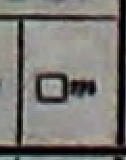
□m
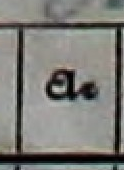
Ac
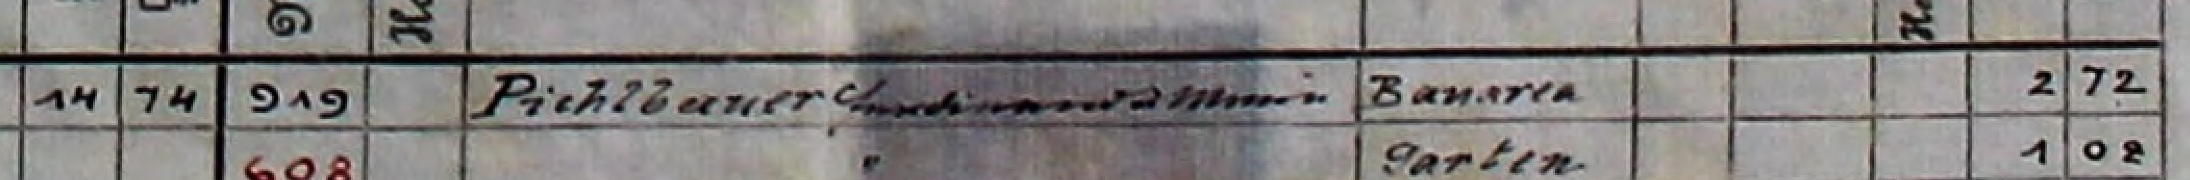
14 74 9^9 Pichlbauer Ferdinand Maria Banaria 2 72
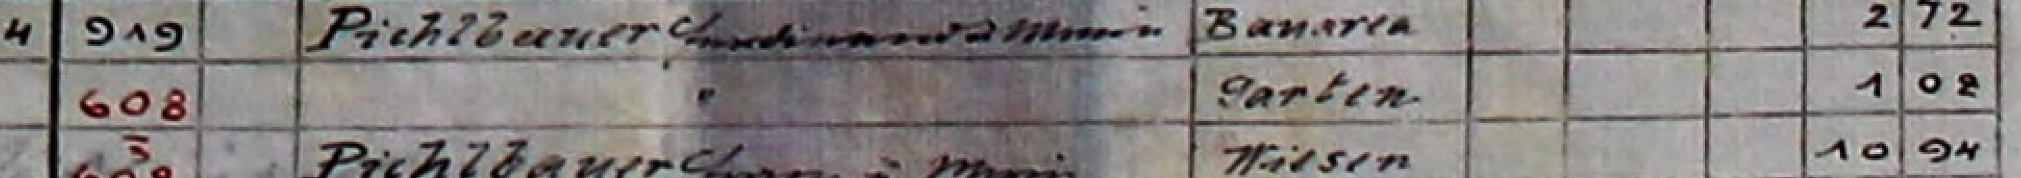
608/3 "Garten 1 02
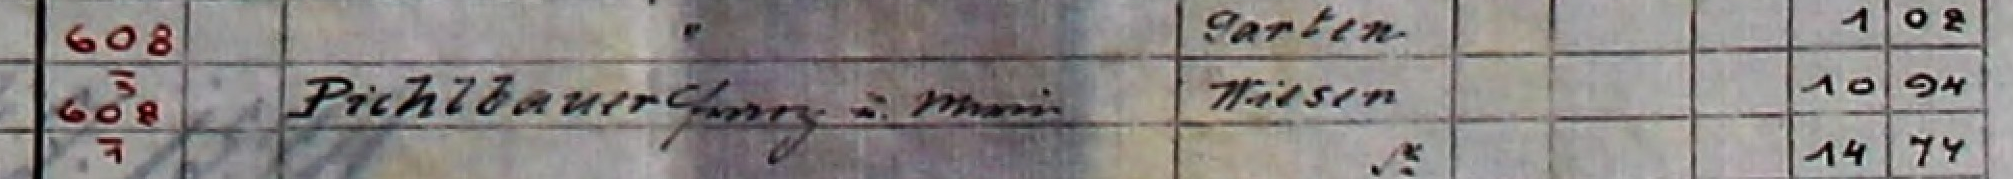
608 Pichlabuer Franz u. Maria Wilsen 10 94
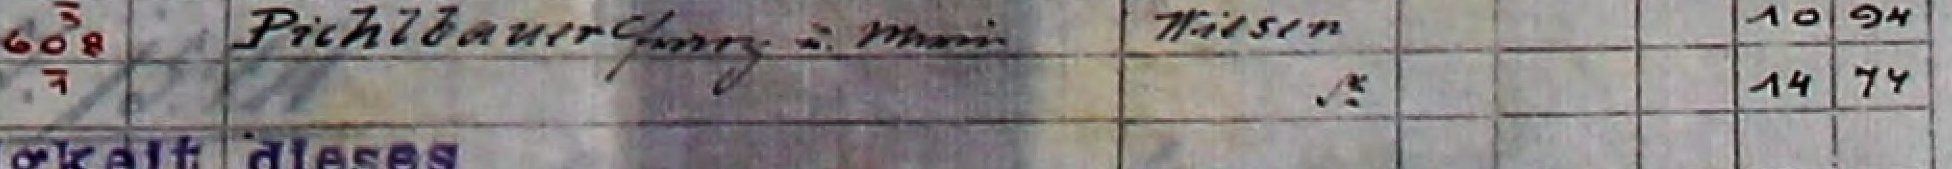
7 Sk 14 74
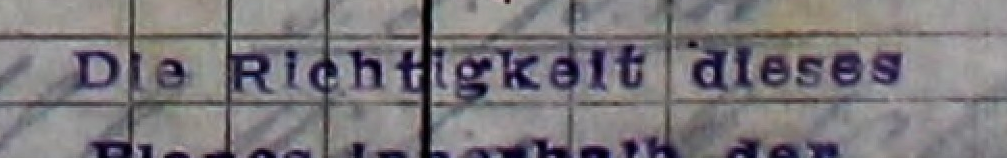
Die Richtigkeit dieses
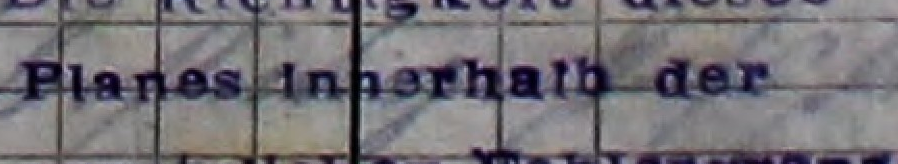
Planes innerhalb der
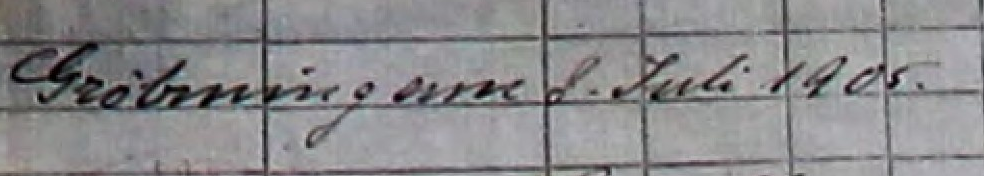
Gröbming am d. Juli 1905.
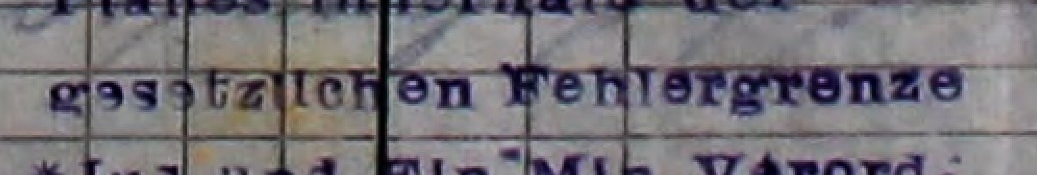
gesetzlichen Fehlergerenze
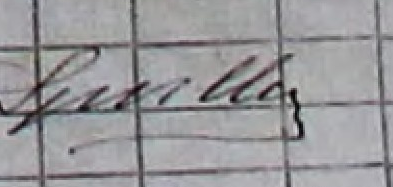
???
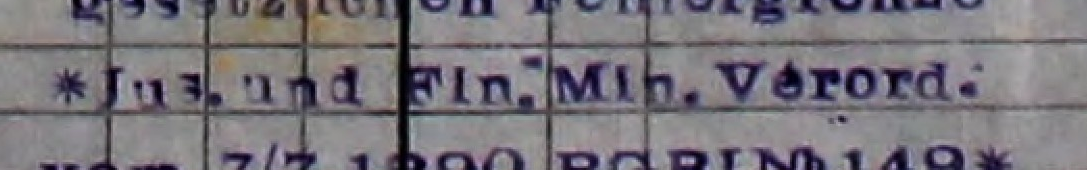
* Ju?. und Fln. Mln. Verord.
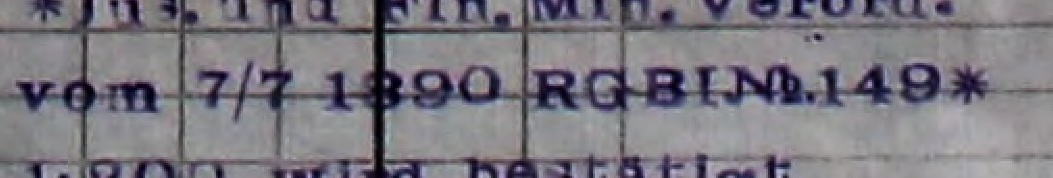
vom 7/7 1890 RGBINb. 149*
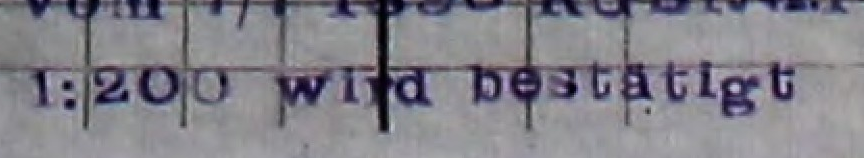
1:200 wird bestätigt
